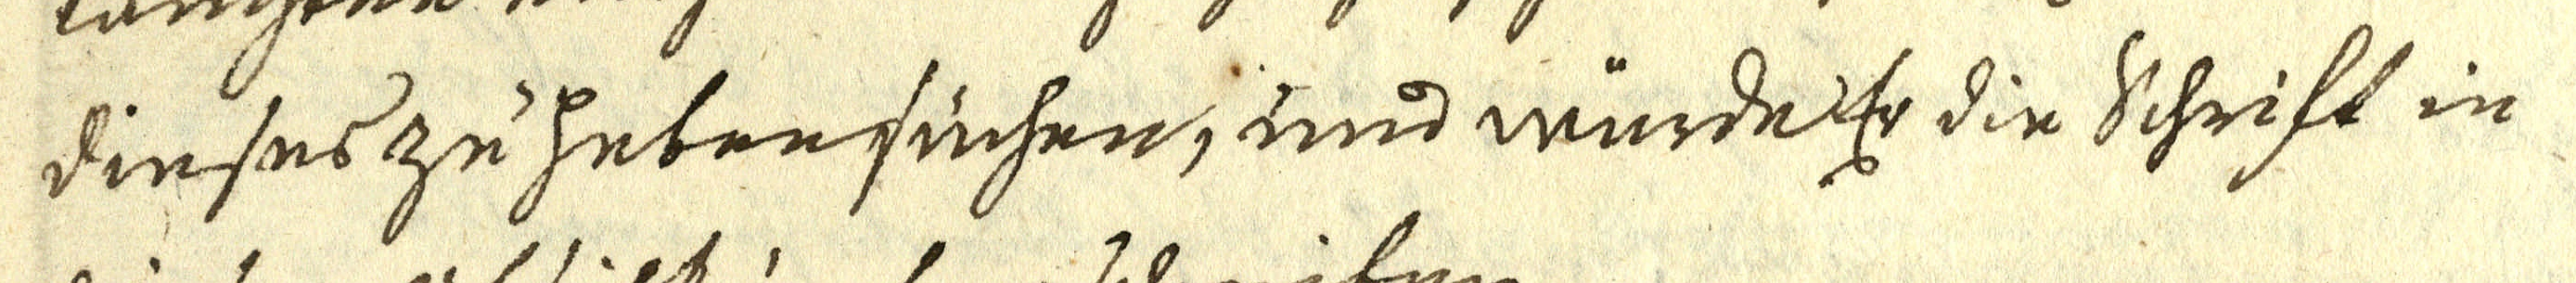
dieses zu heben suchen, und würde die Schrift in
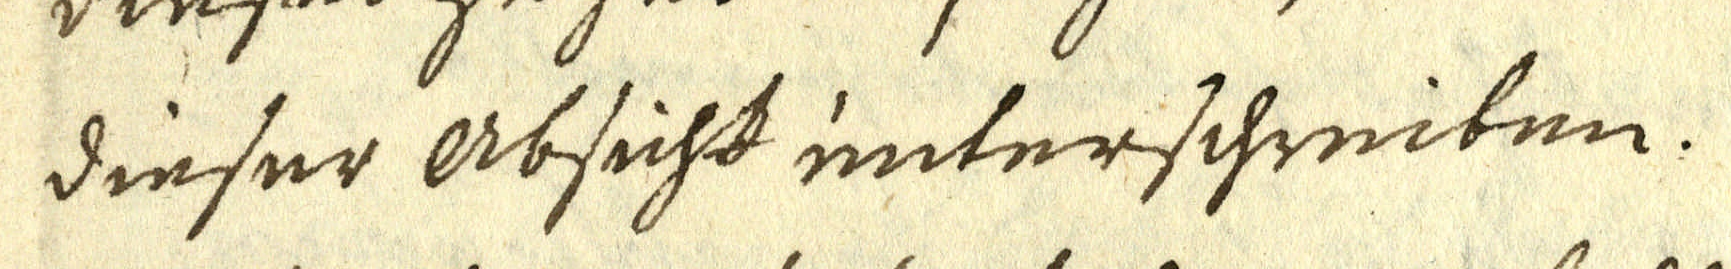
dieser Absicht unterschreiben.
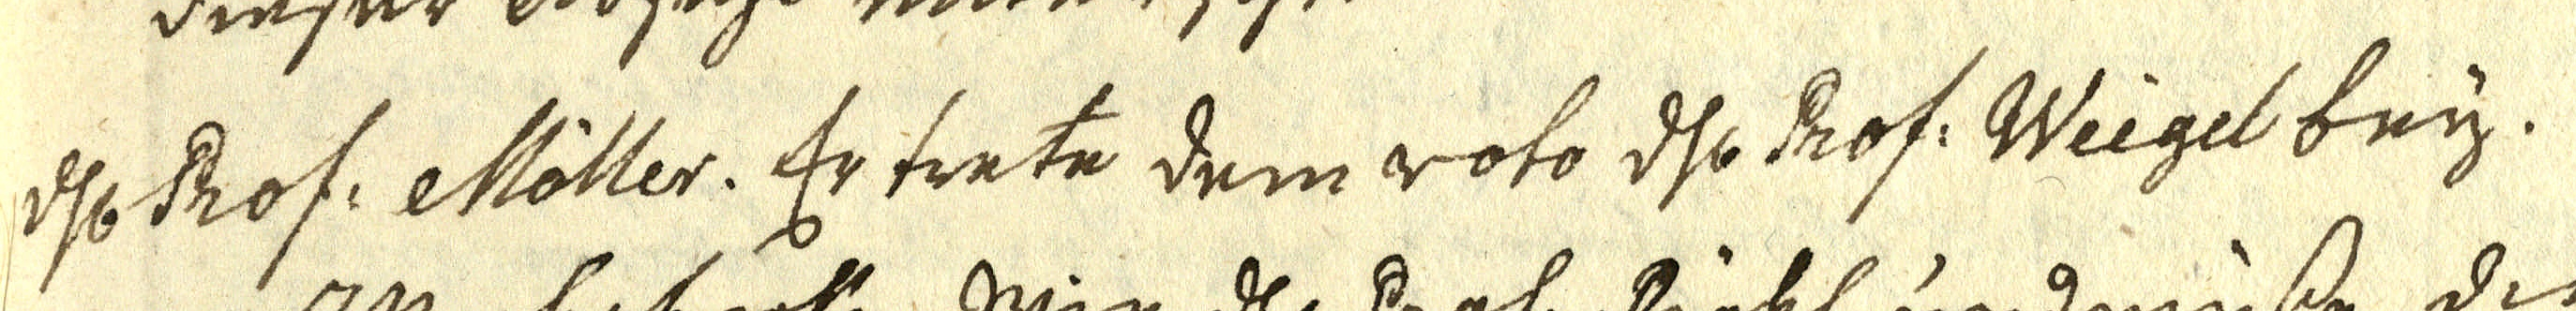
dh Prof. Möller. Er trete dem voto dh Prof. Weigel beÿ.
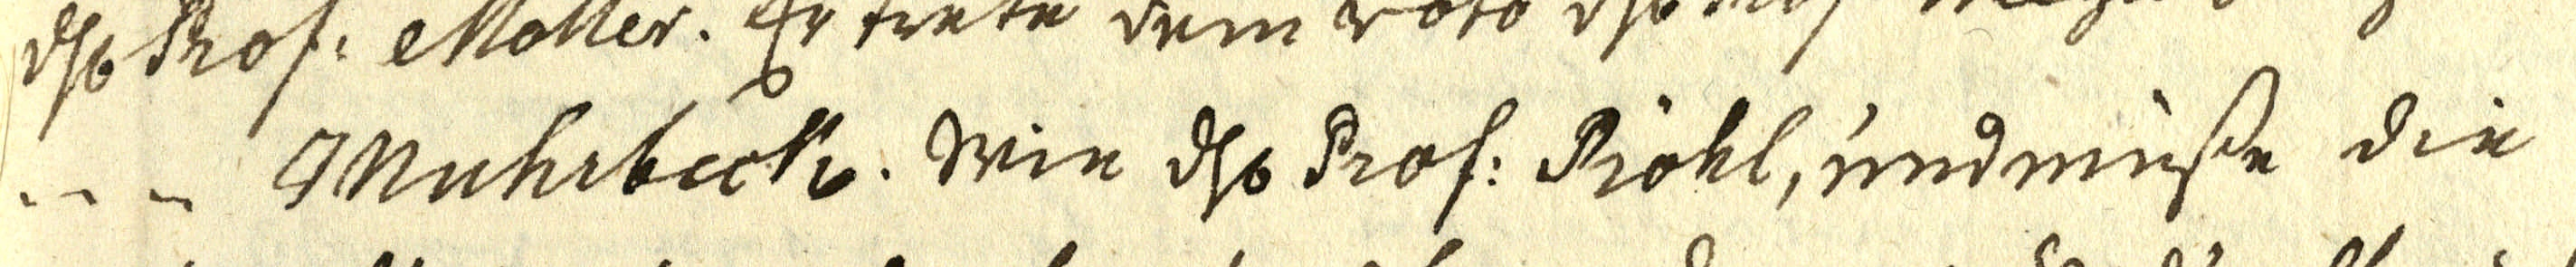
Muhrbeck. Wie dh Prof. Röhl, und müße die
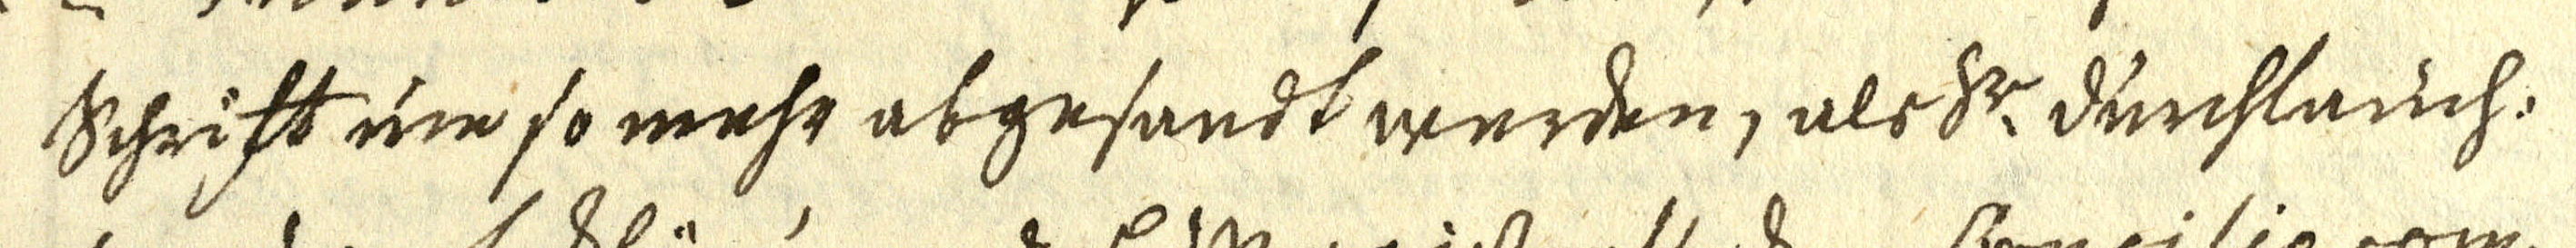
Schrift um so mehr abgesandt werden, als Sr. Durchlauch¬
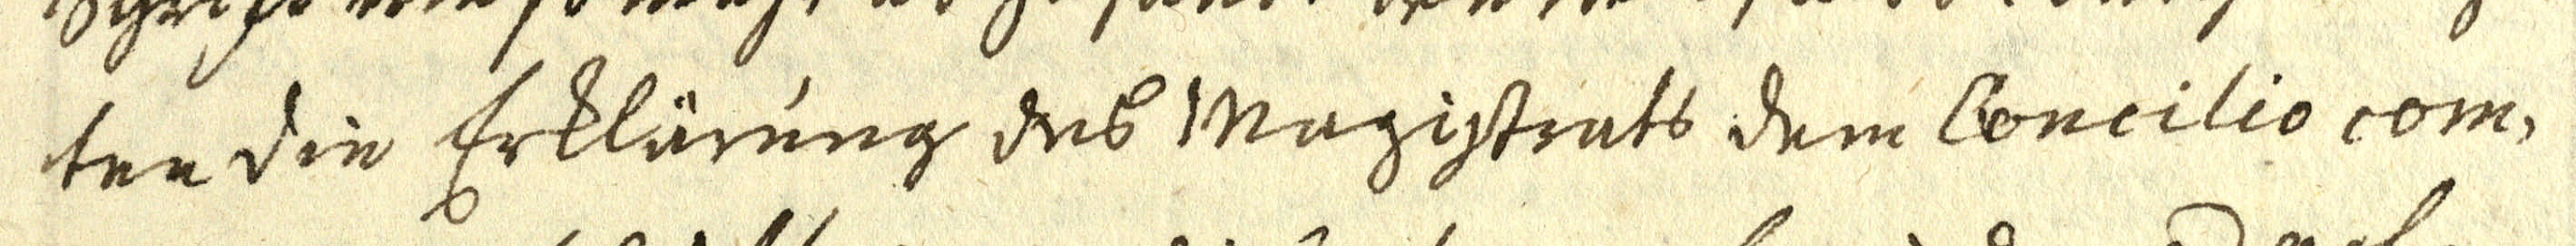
ten die Erklärung des Magistrats dem Concilio com¬
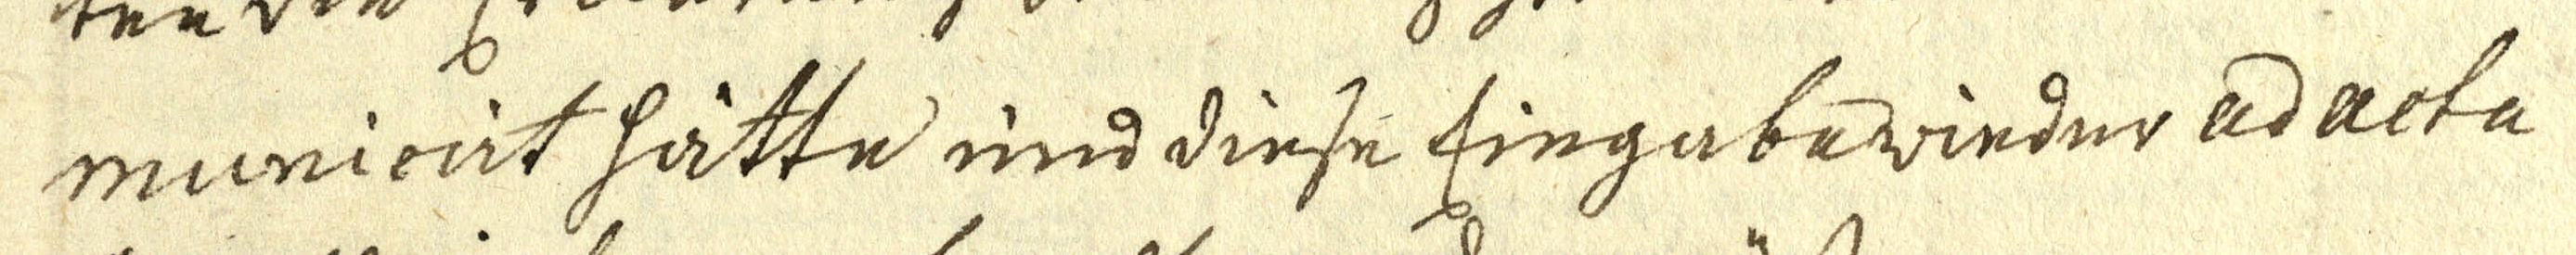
municirt hätte und diese Eingabe wieder ad Acta
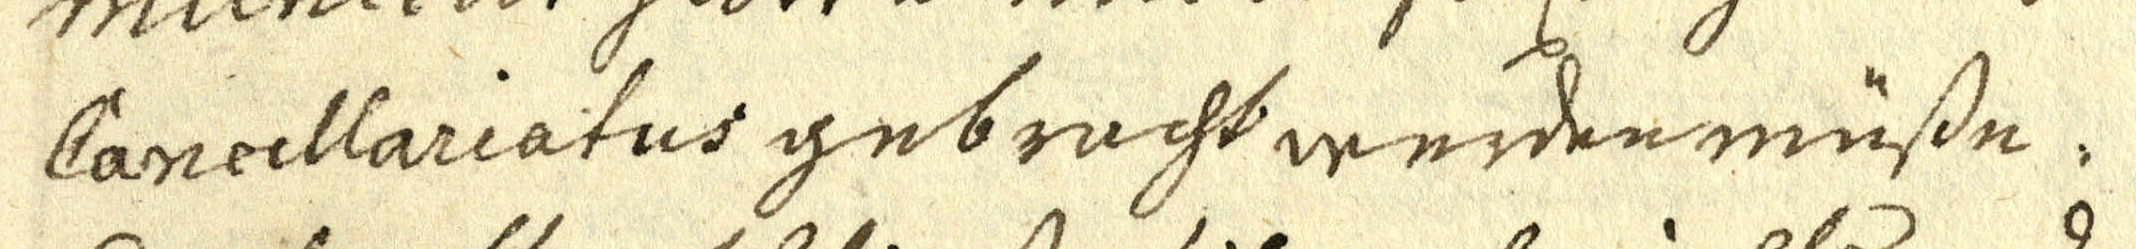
Cancellariatus gebracht werden müße.
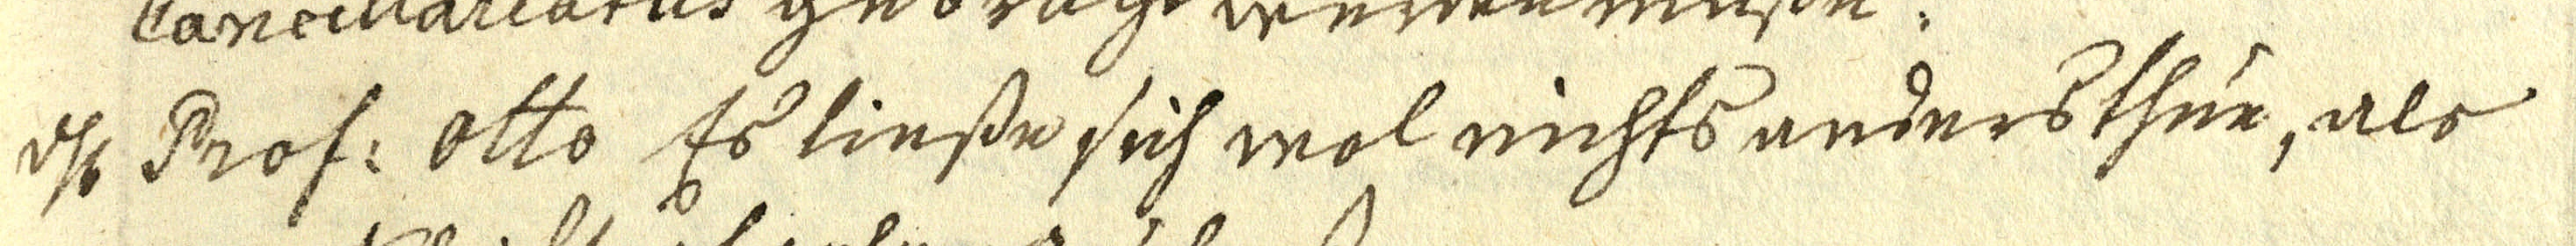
dh Prof. Otto Es ließe sich wol nichts anders thun, als
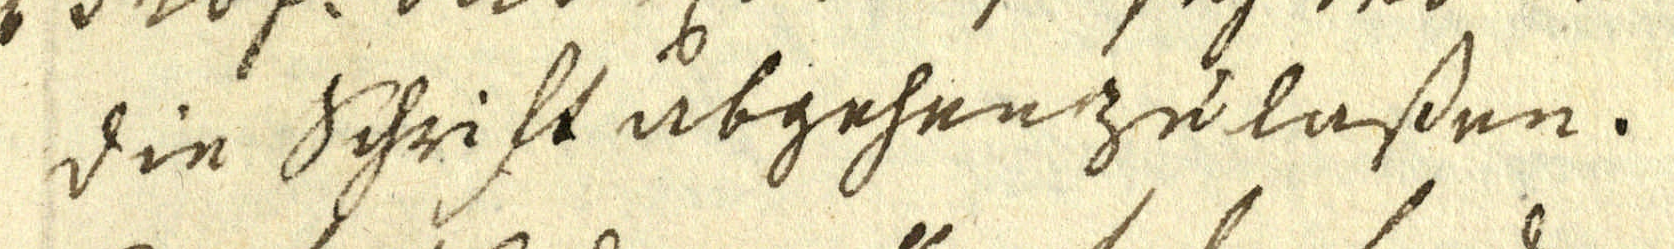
die Schrift abgehen zu laßen.
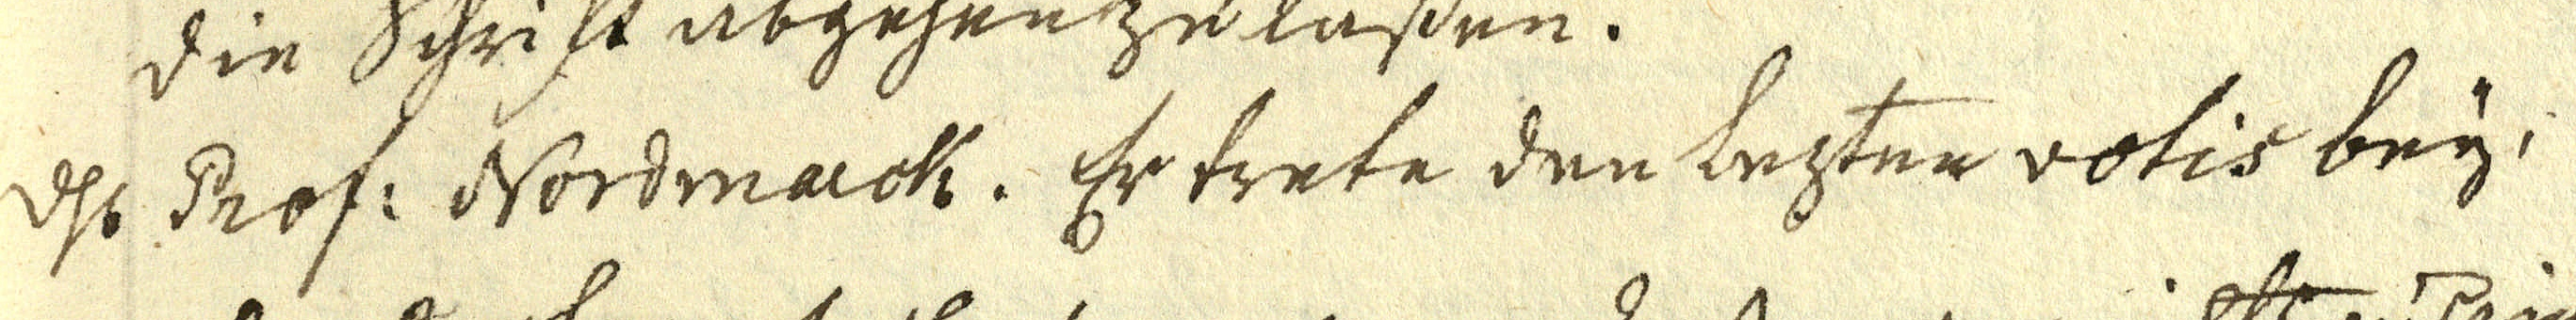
dh Prof. Nordmarck. Er trete den lezten votis beÿ.
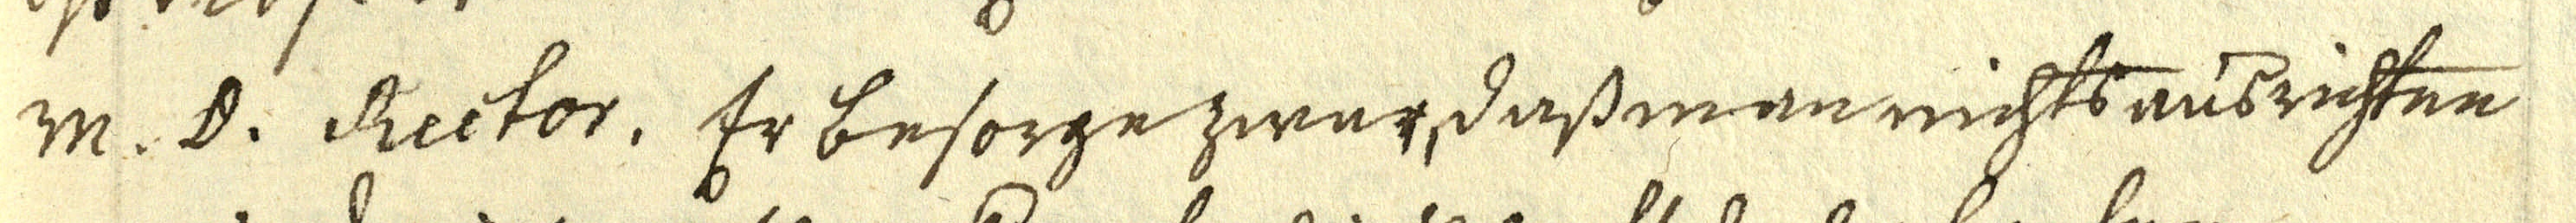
M. D. Rector. Er besorge zwar, daß man nichts ausrichten
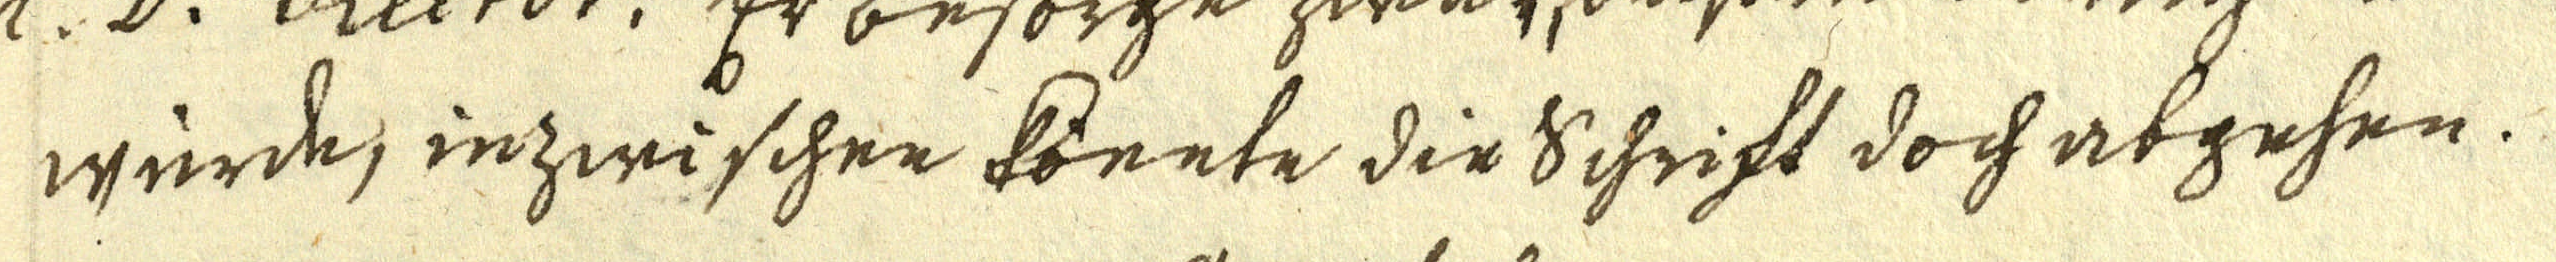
würde, inzwischen könnte die Schrift doch abgehen.
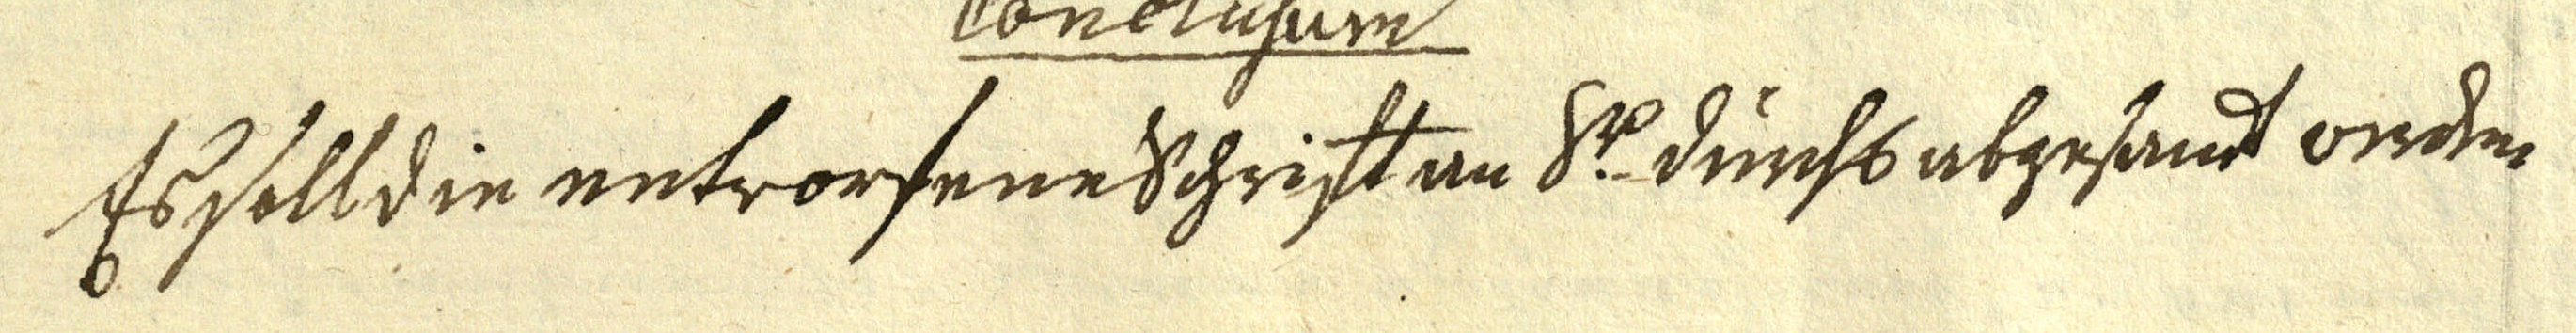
Es soll die entworfene Schrift an Sr Durchl. abgesandt werden
